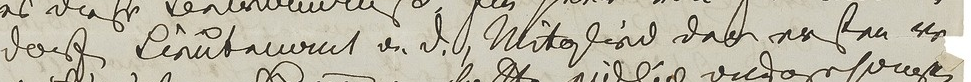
dorf, Lieutenant a. D., Mitglied der ersten re-
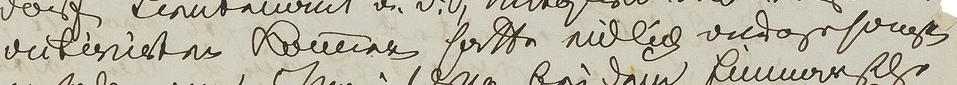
activirten Kammer, hatte eidlich ausgesagt,
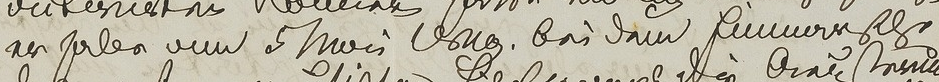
er habe am 5 Mai 1849. bei dem Einmarsche
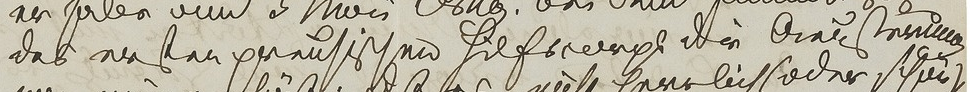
des ersten preusischen Hilfscorps die Aeußerung
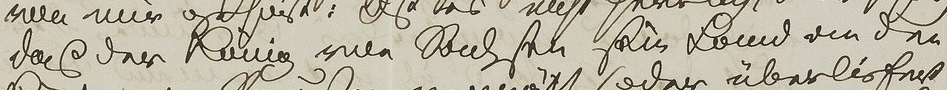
daß der König von Sachsen sein Land an den
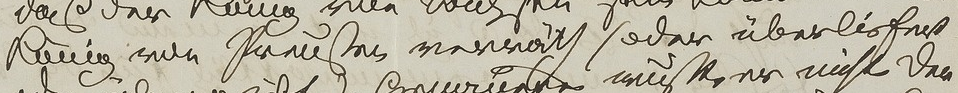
König von Preußen verräth (oder überliefert
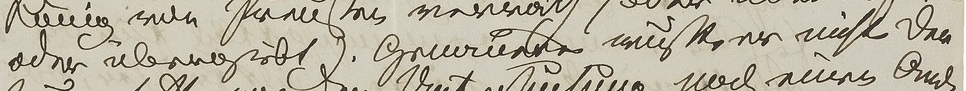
oder übergiebt). Genaueres wußte er nicht. Der
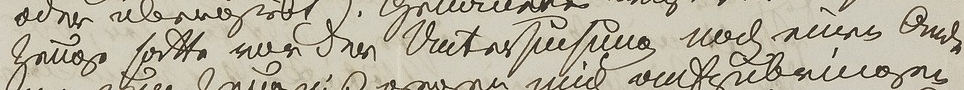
Zeuge hatte vor der Untersuchung noch einen And-
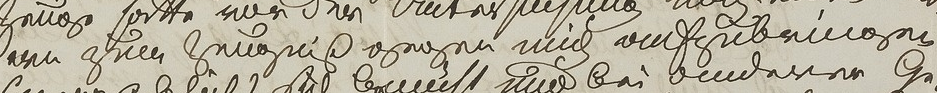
ern zum Zeugniß gegen mich aufzubringen
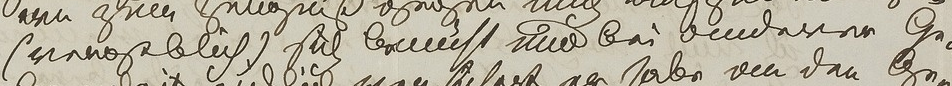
(vergeblich) sich bemüht und bei anderer Ge-
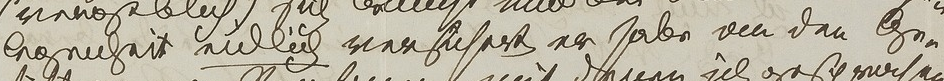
legenheit eidlich versichert, er habe an den Ge-
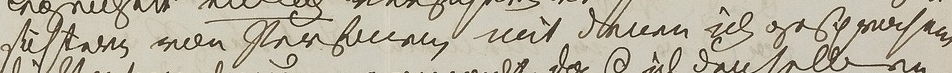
sichtern von Personen, mit denen ich gesprochen,
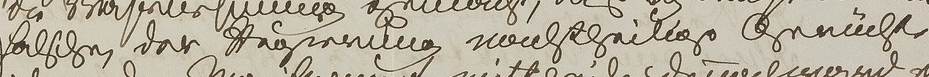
falsche, der Regierung nachtheilige Gerüchte
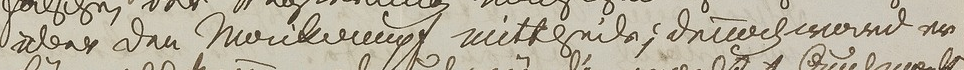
über den Maikampf mittheile; dennoch ward er
